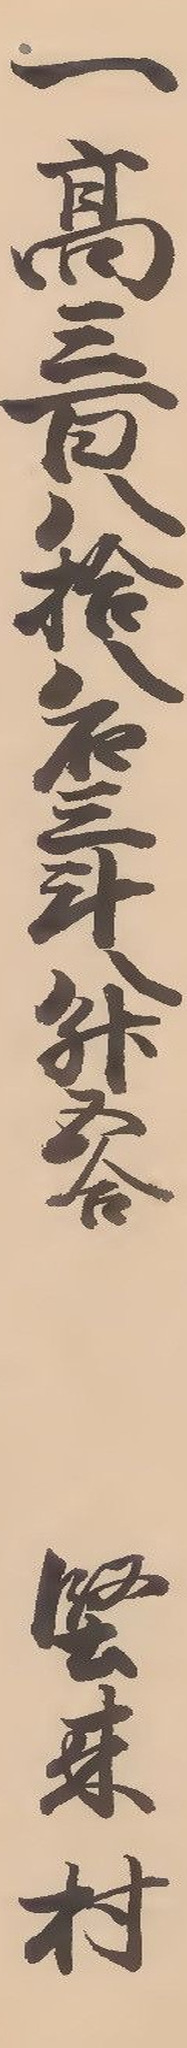一高三百八拾八石三斗升八升五合堅来村
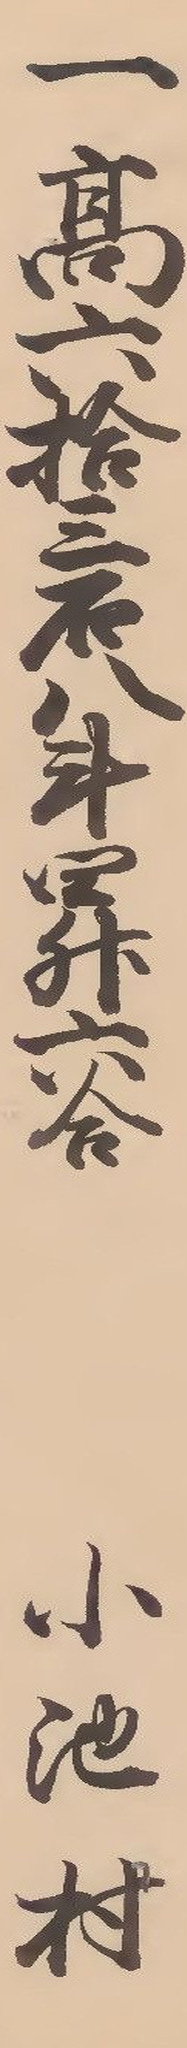一高六拾三石八斗四升六合小池村
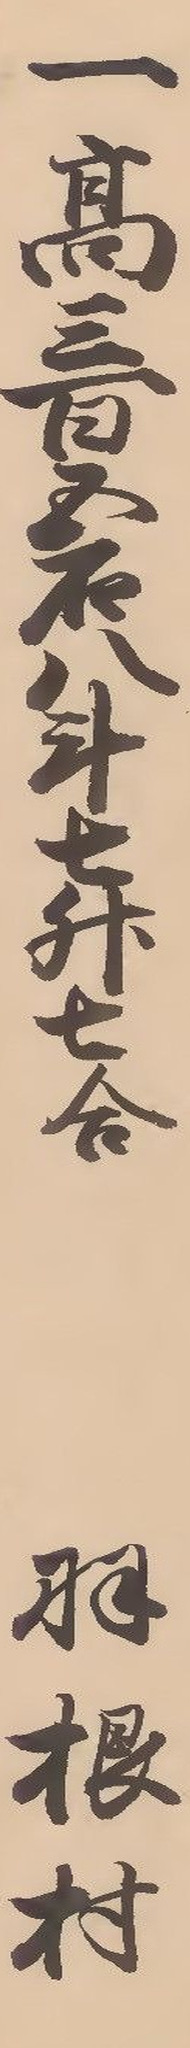一高三百五石八斗七升七合羽根村
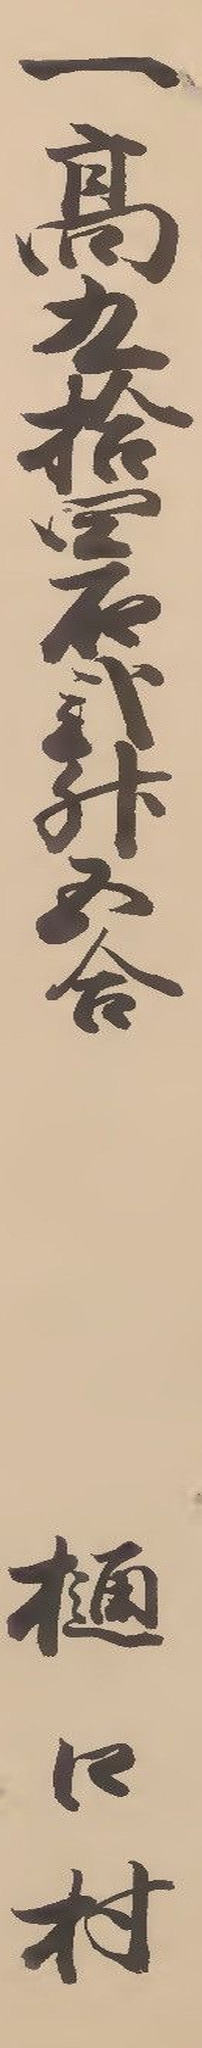一高九拾四石弐升五合樋口村
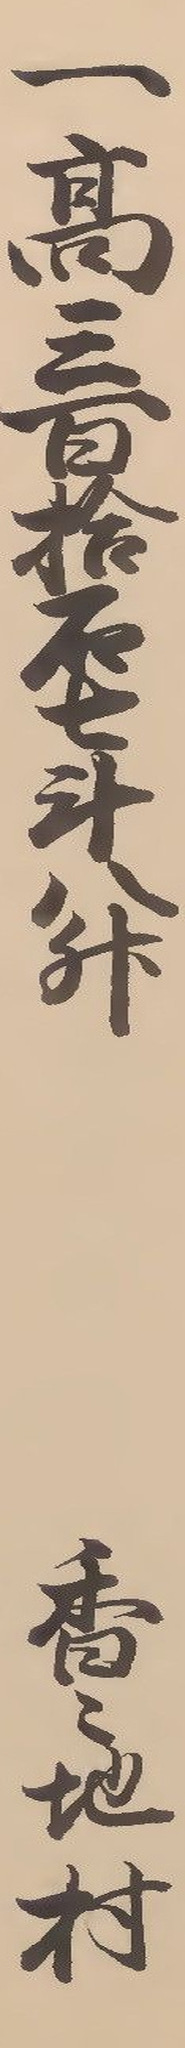一高三百拾石七斗八升香々地村
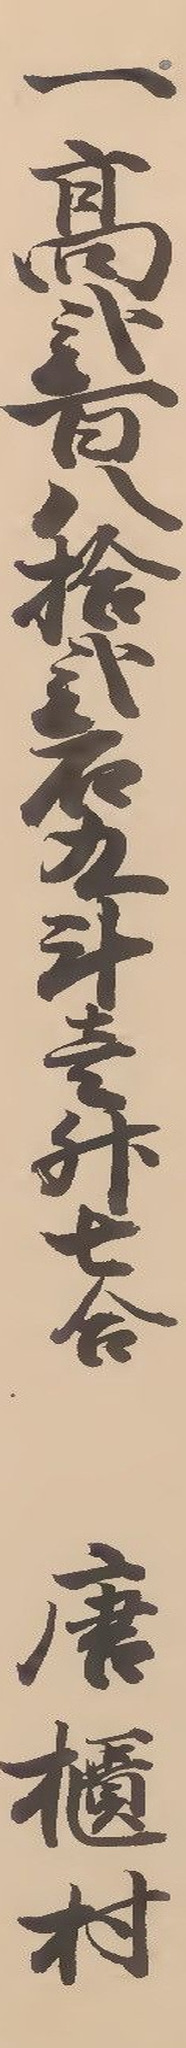一高弐百八拾弐石九斗壱升七合唐櫃村
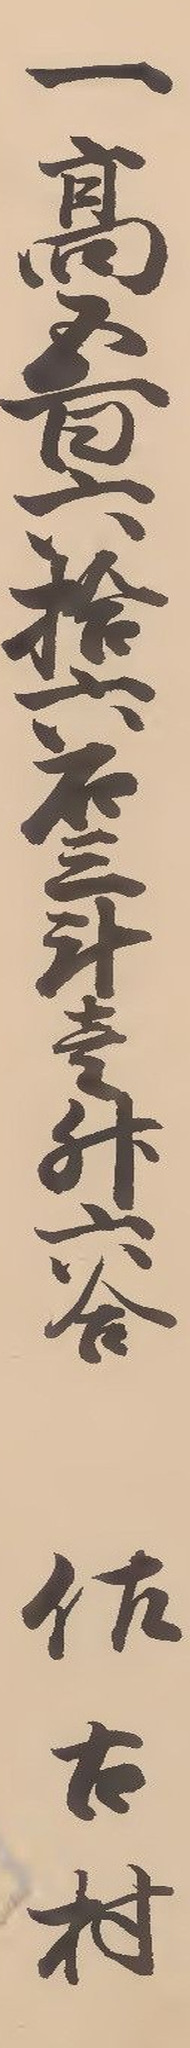一高五百六拾六石三斗壱升六合佐古村

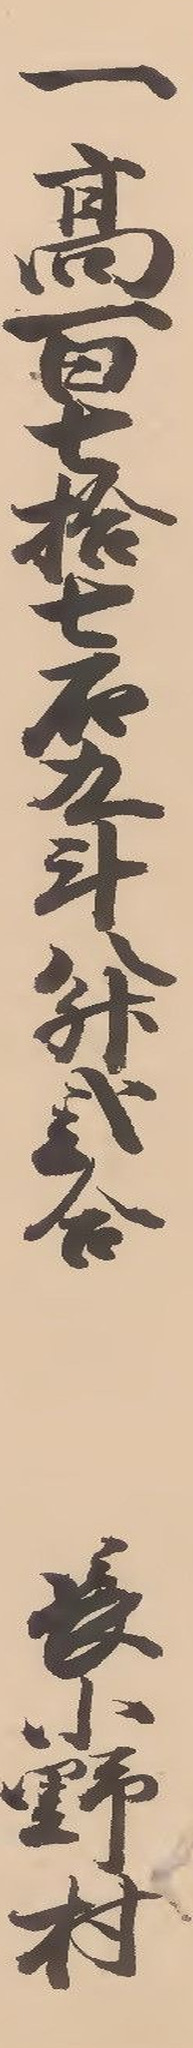一高百七拾七石九斗八升弐合長小野村
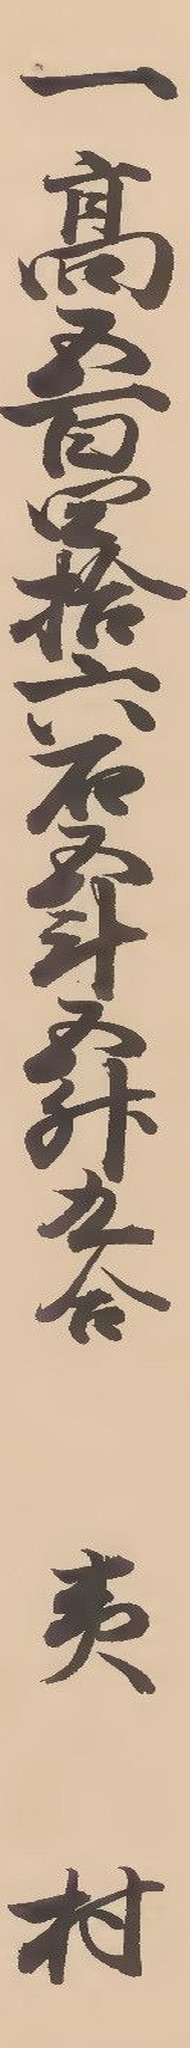一高五百四拾六石五斗五升九合夷村
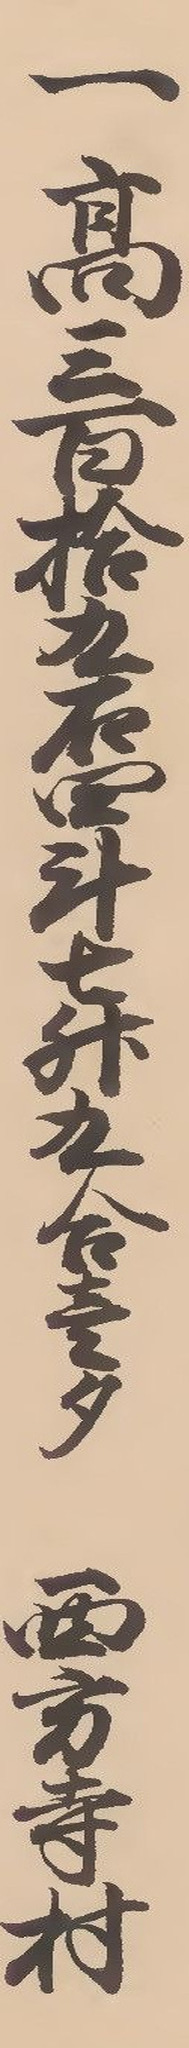一高三百拾九石四斗七升九合壱勺西方寺村
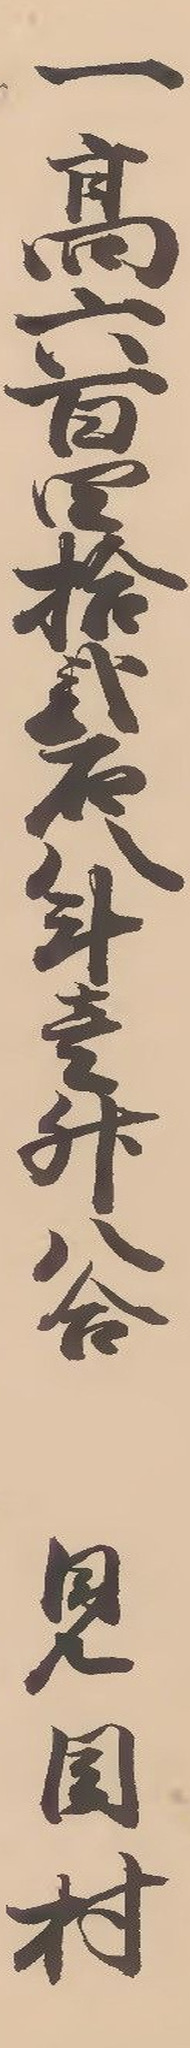一高六百四拾弐石八斗壱升八合見目村
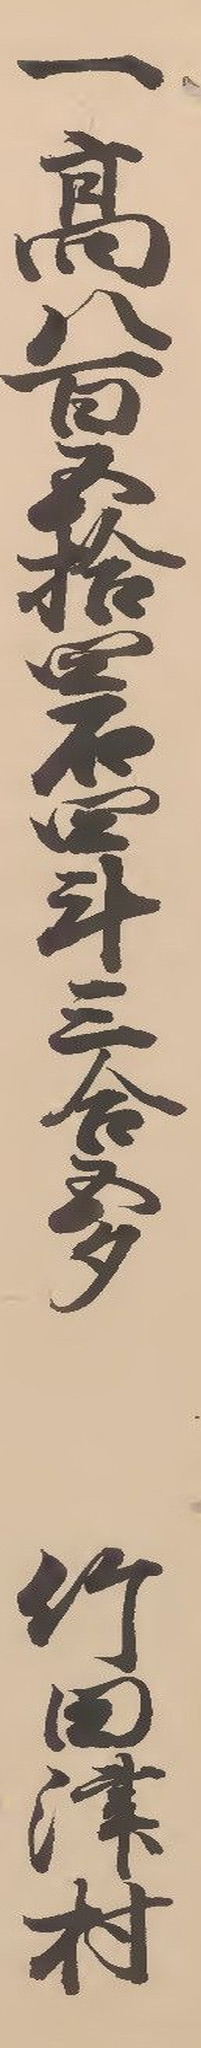一高八百五拾四石四斗三合五勺竹田津村
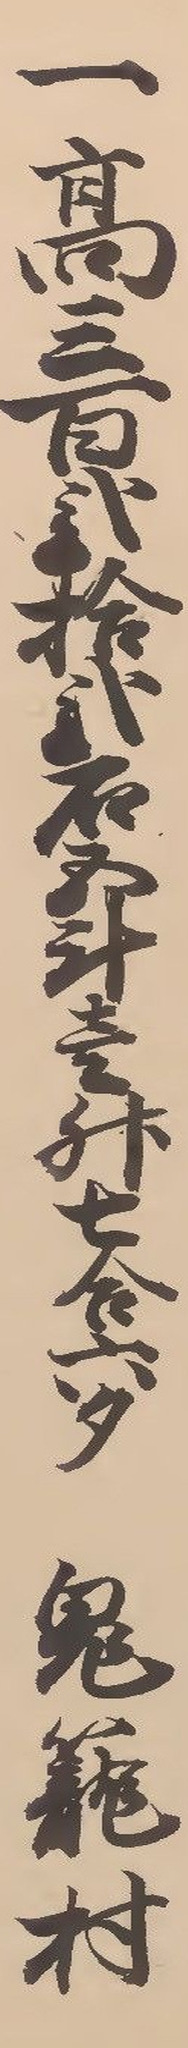一高三百弐拾弐石五斗壱升七合六勺鬼籠村
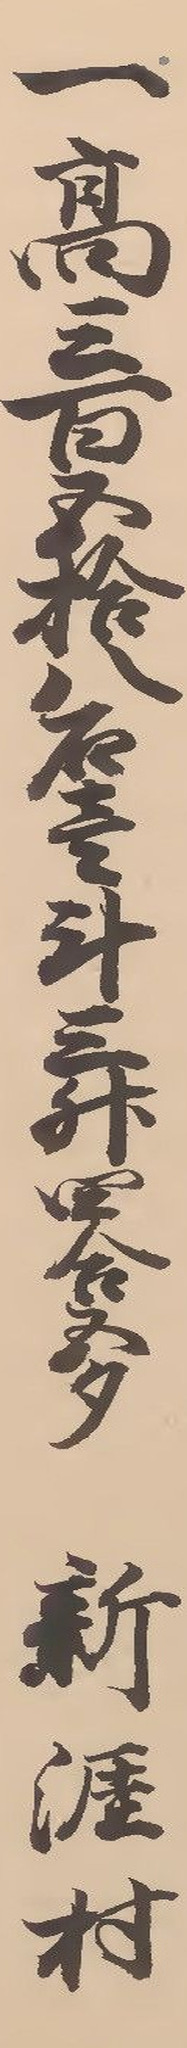一高三百五拾八石壱斗三升四合五勺新涯村
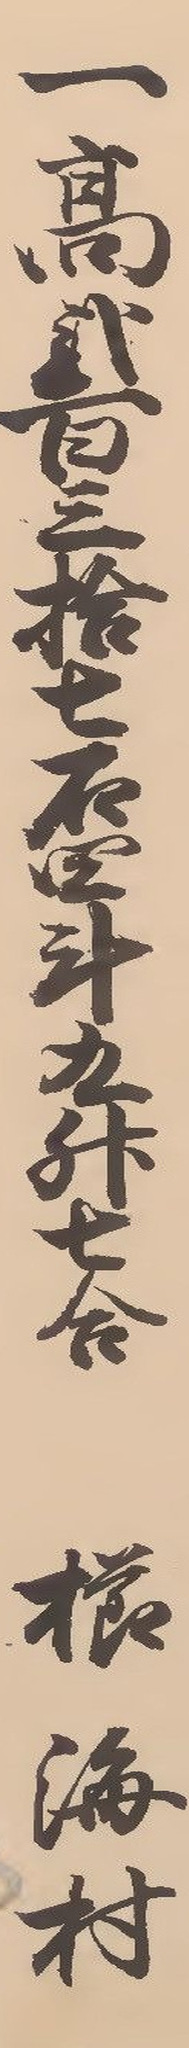一高弐百三拾七石四斗九升七合櫛海村

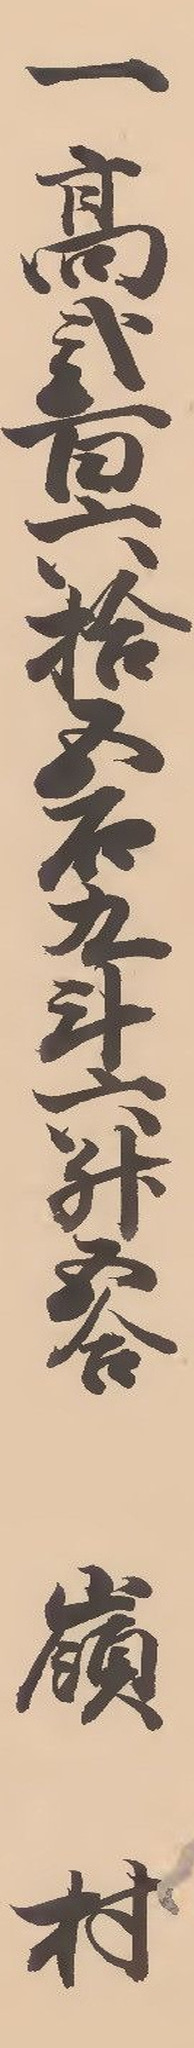一高弐百六拾五石九斗六升五合嶺村
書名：豊後国郷帳
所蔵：国立公文書館 National Archives of Japan
